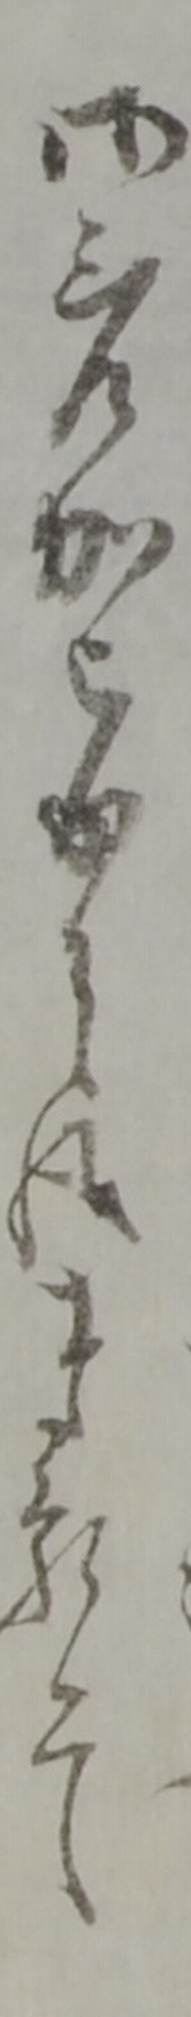御差加被申下候様奉願上候
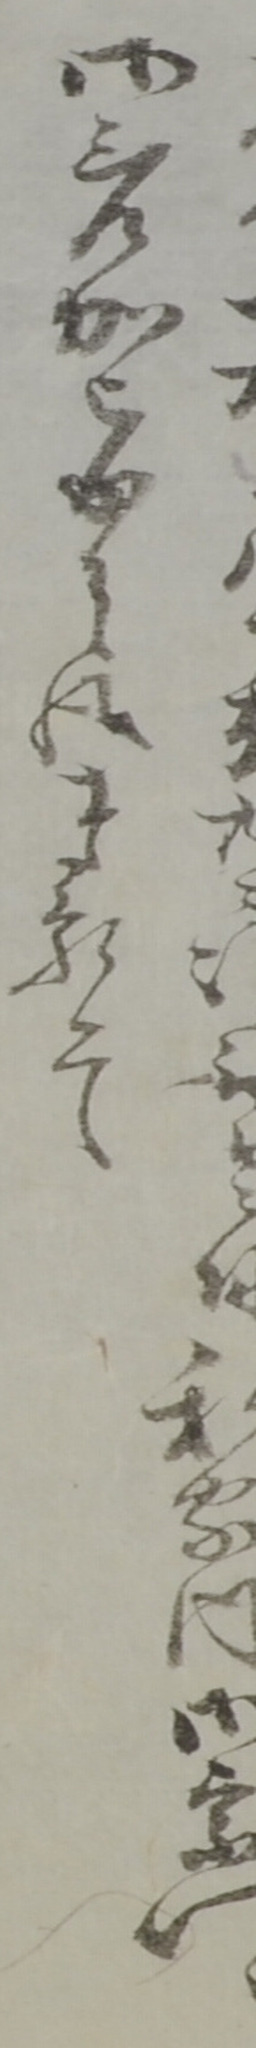御差加被申下候様奉願上候
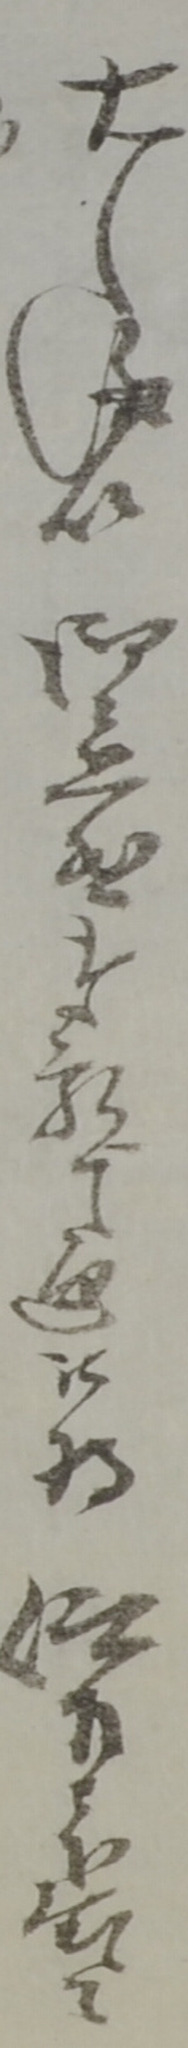右之趣以御慈悲奉願上候通被為仰付被下置候ハヽ
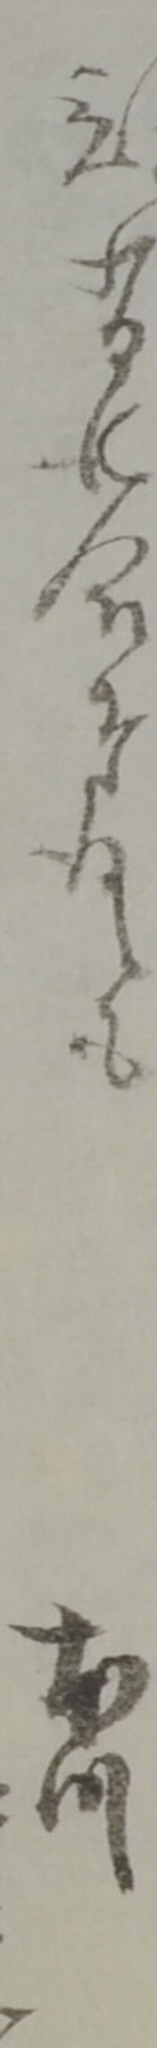難有仕合奉存候以上
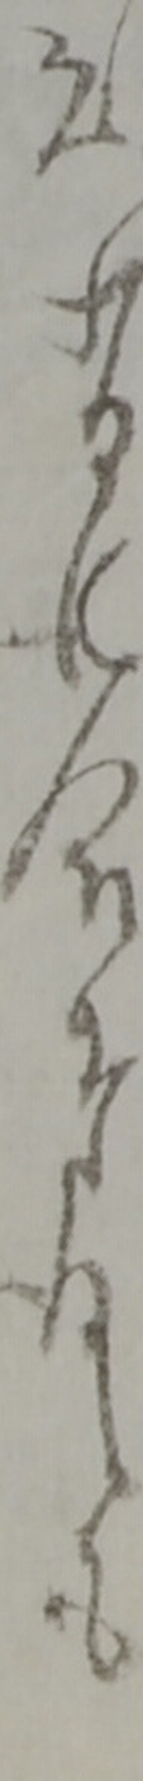難有仕合奉存候以上
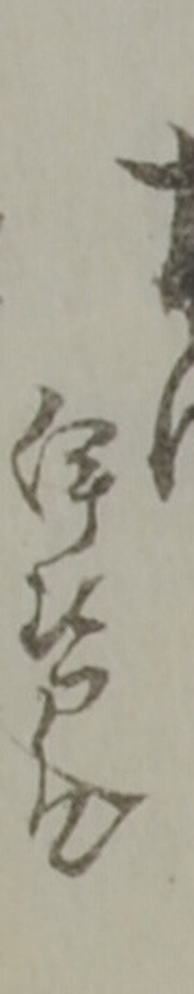伊勢屋
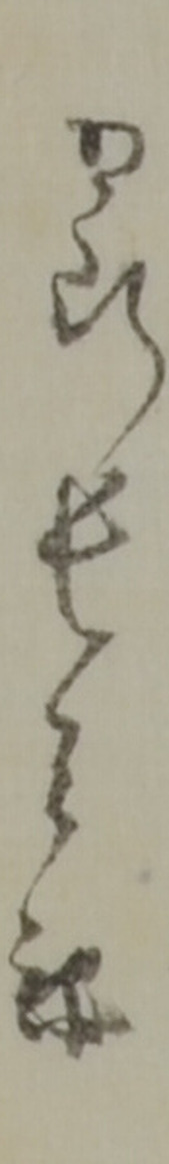同断長兵衛
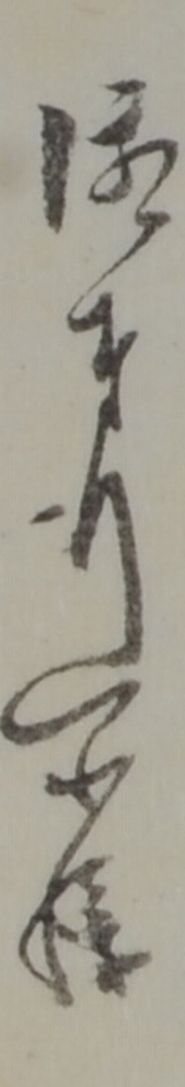御奉行所様
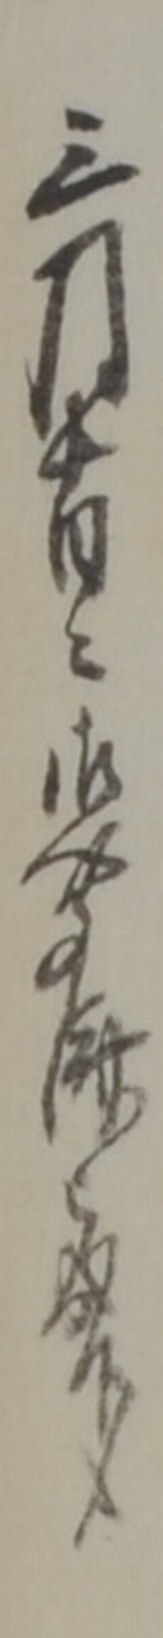三月十日ニ御聞済被成下候
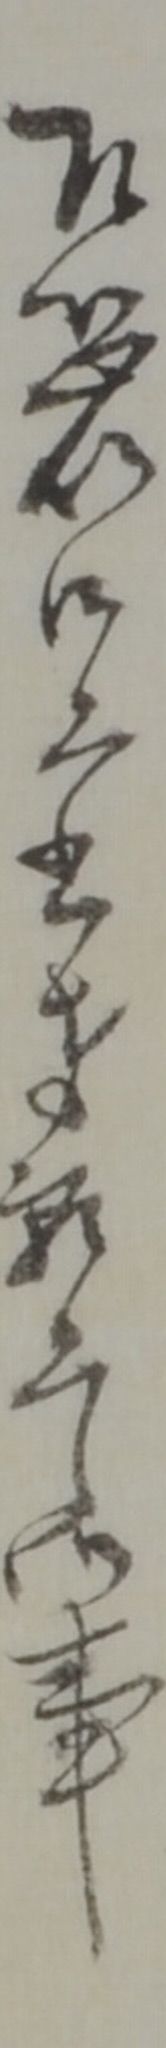乍恐以口上書奉願上候御事
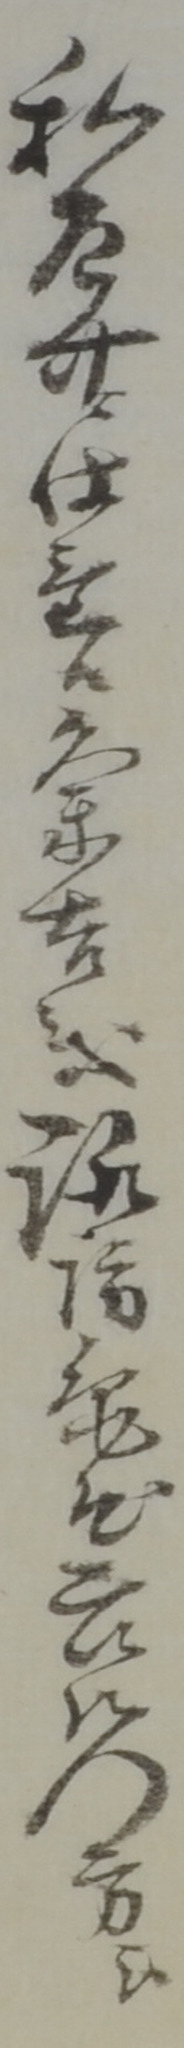私厄介ニ仕置候久米吉義諏訪亀屋節右衛門方え
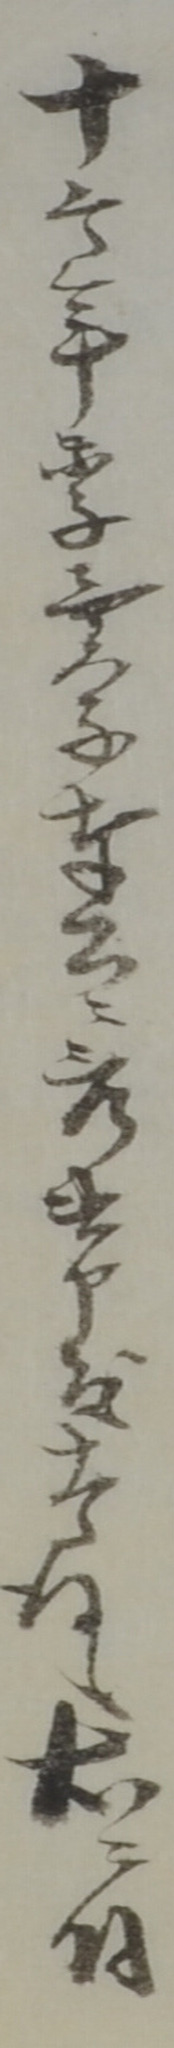十ケ年季売子奉公ニ差出申度奉存候右ニ付
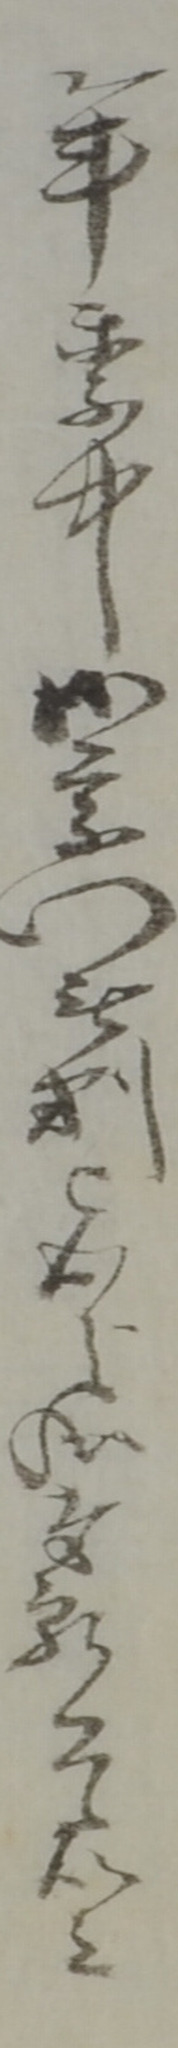年季中御宗門無判被成下候様奉願上候以上
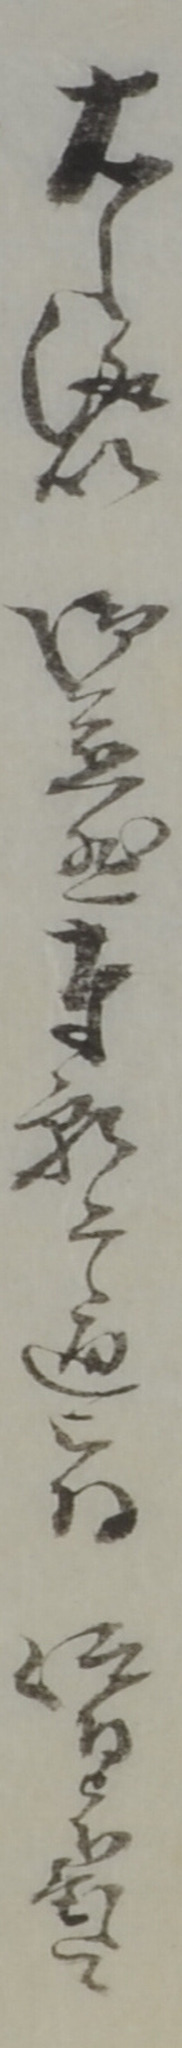右之趣以御慈悲奉願上候通被為仰付被下置候ハヽ
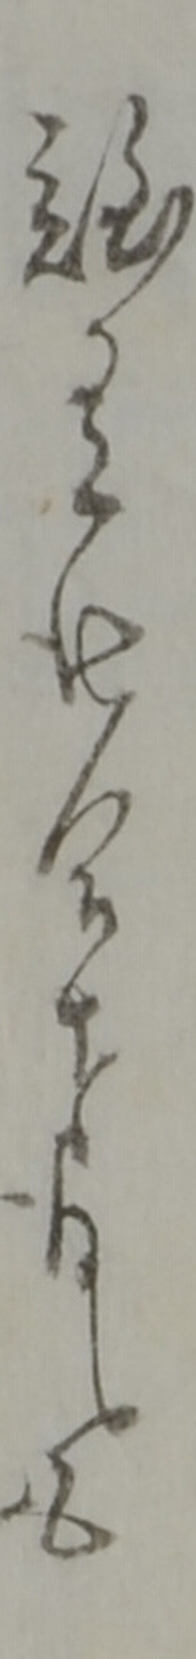難有仕合奉存候以上
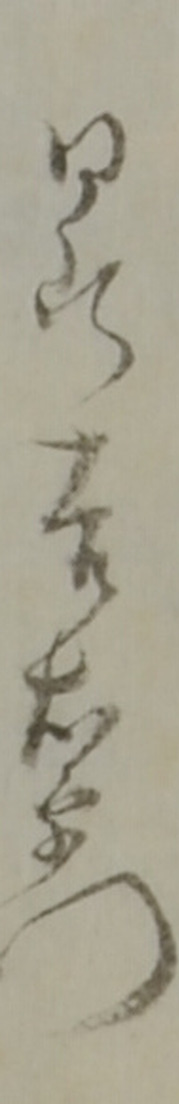同断吉右衛門
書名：諸願書控帳
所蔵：伊那市立高遠町図書館・合同会社AMANE
